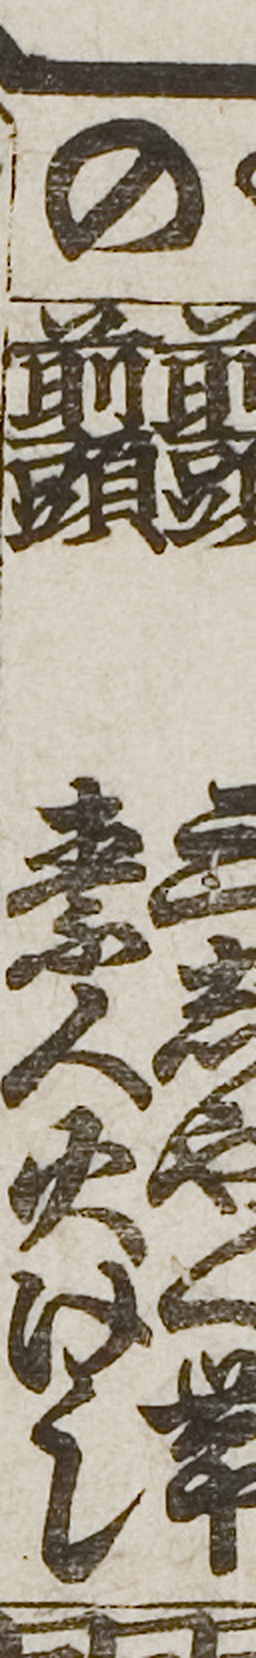前頭素人火けし
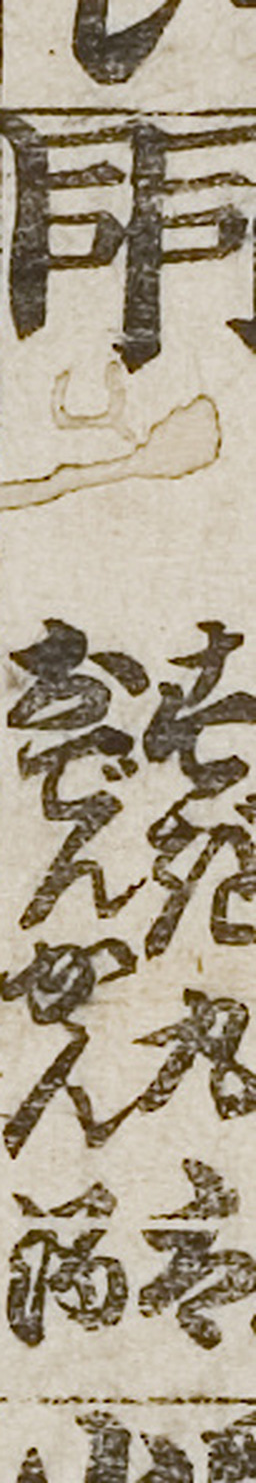同おでんかん酒
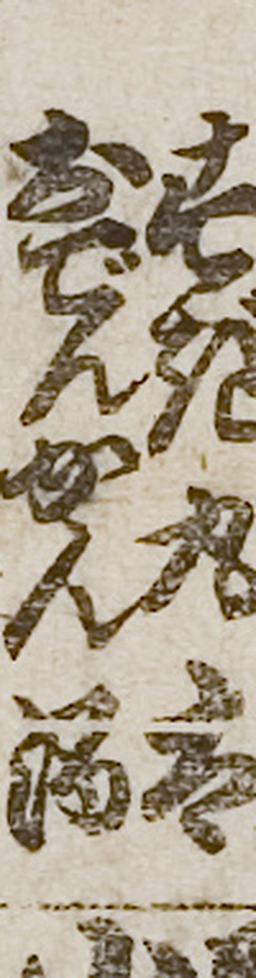同おでんかん酒
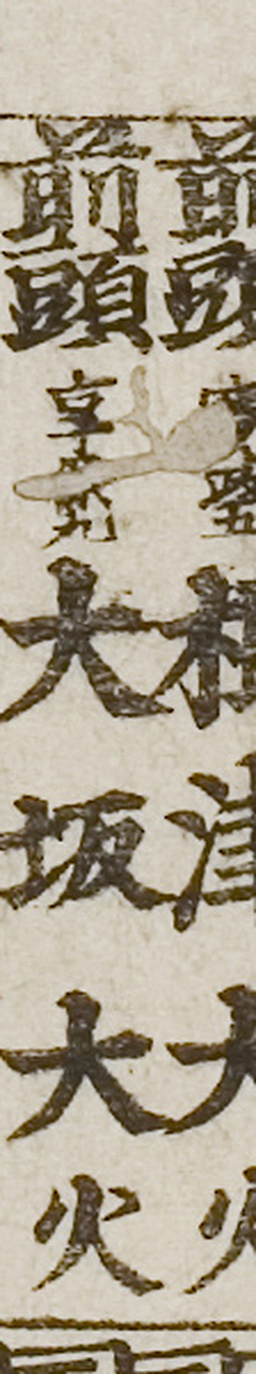前頭享保九大坂大火
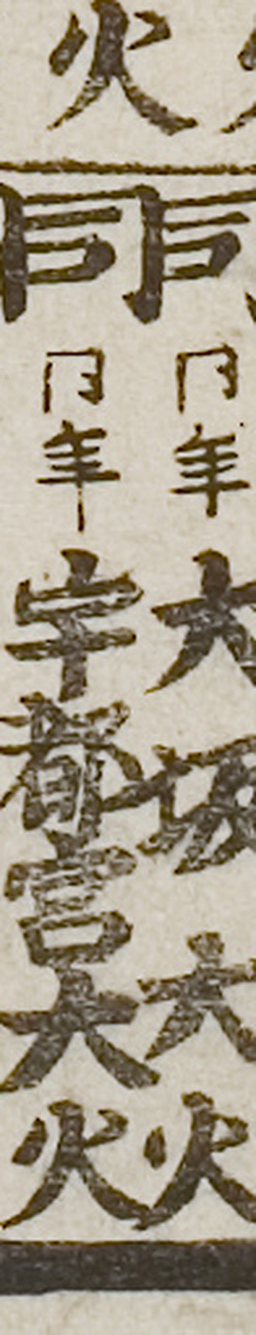同同年宇都宮大火
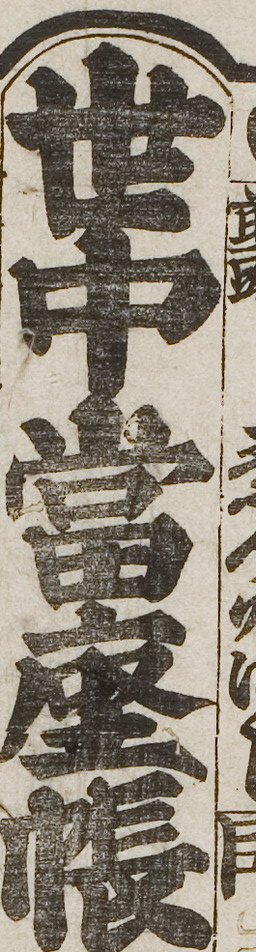世中当座帳
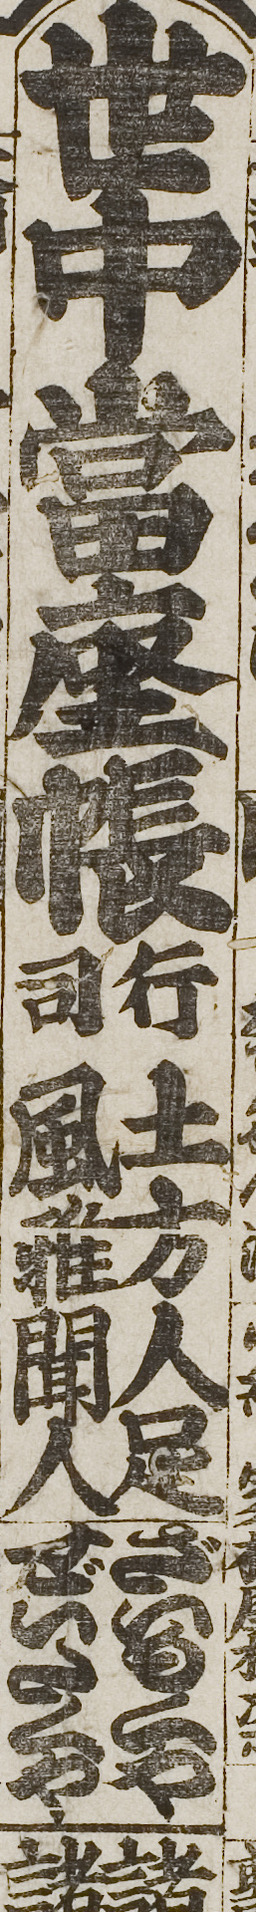世中当座帳
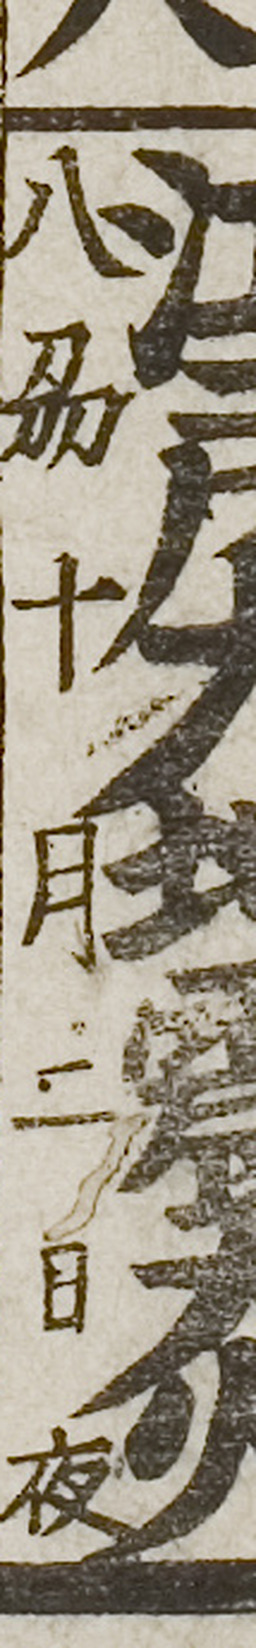八州十月二日夜
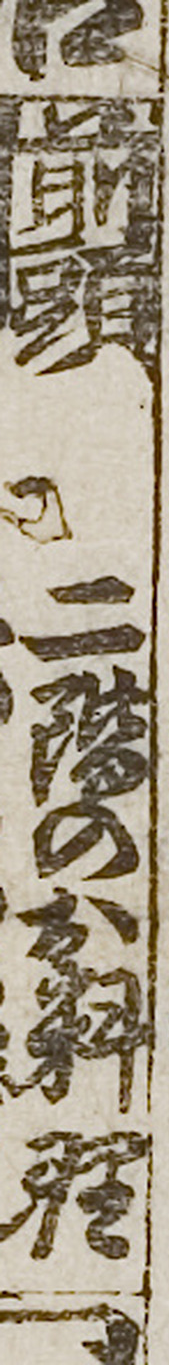前頭二階のお料理
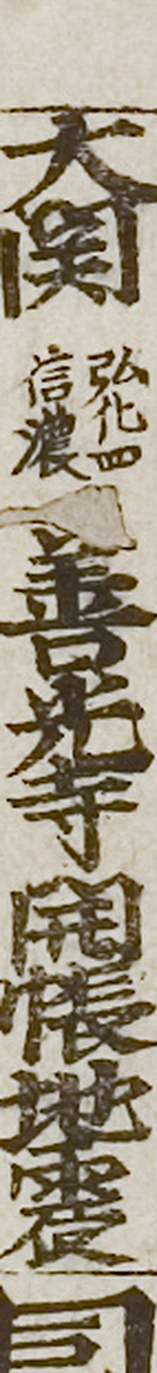大関弘化四信濃善光寺開帳地震
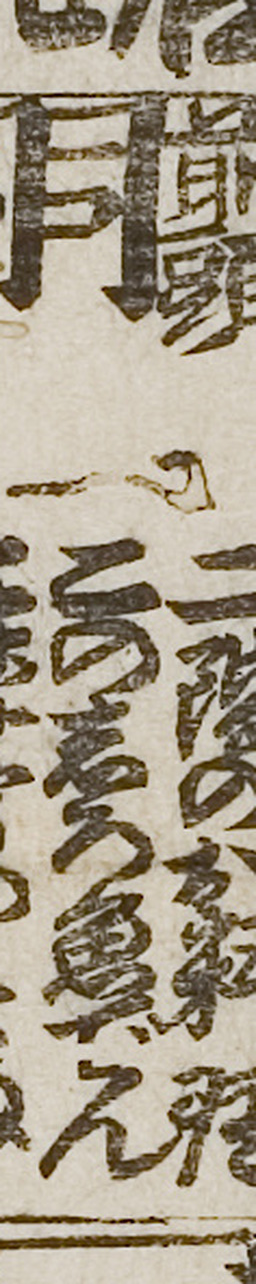同このしろ魚でん
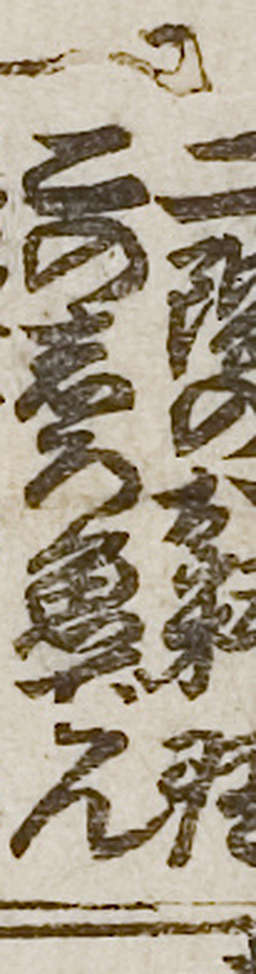同このしろ魚でん
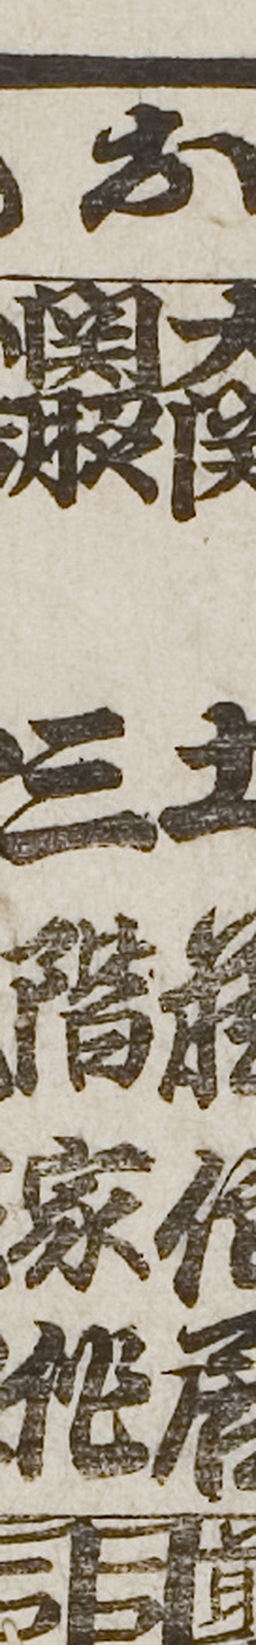関取三階家作
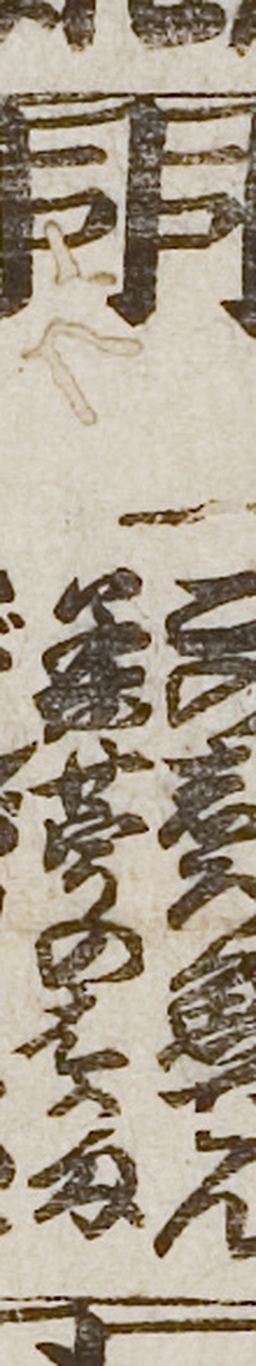同茶亭のはかま
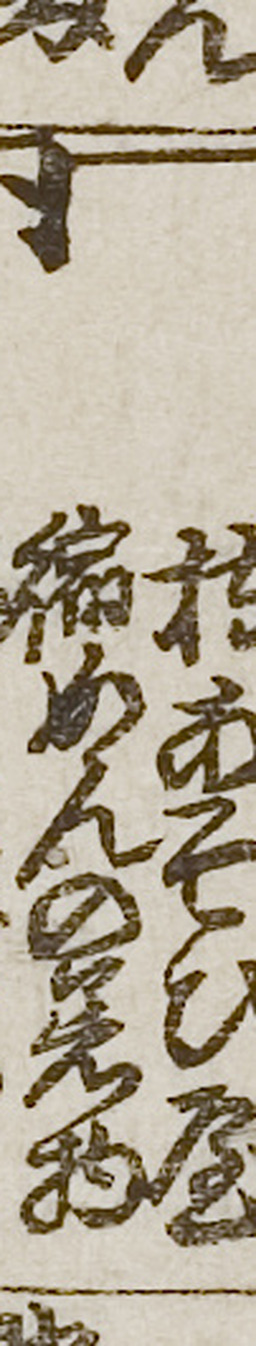同縮めんの着物
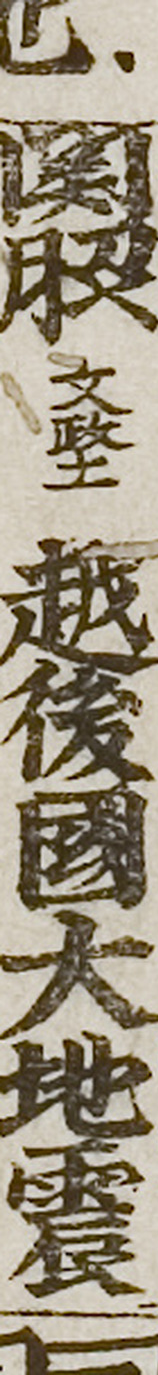関取文政十一越後國大地震
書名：世中当座帳
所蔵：東京大学総合図書館 General Library in the University of Tokyo, JAPAN
